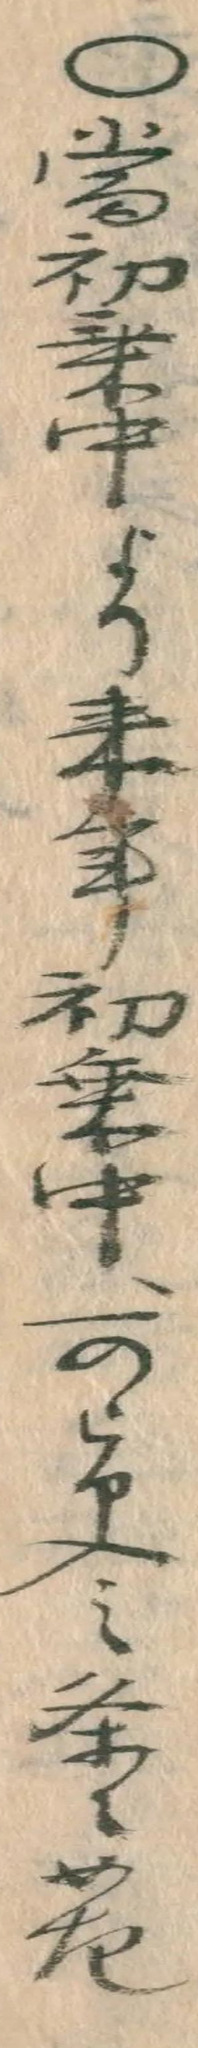○當初中より来年初乗中ヘ可被申入之条々如左
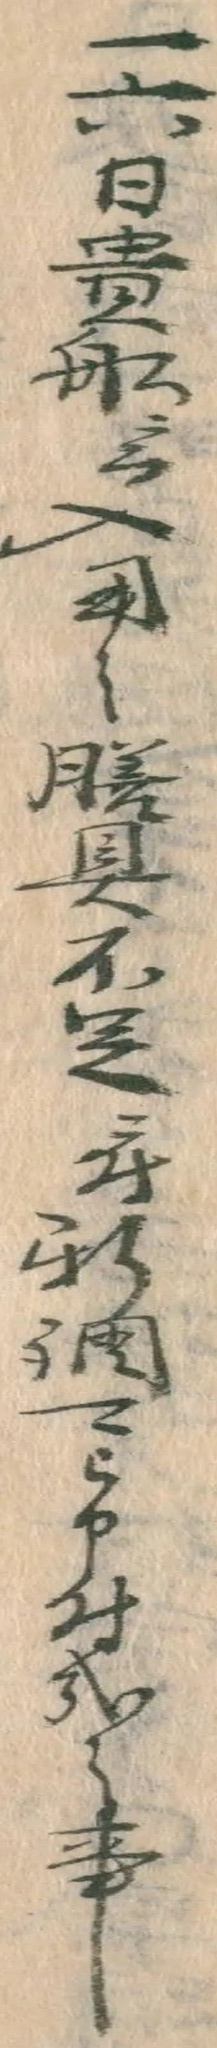一六日貴舩ニ而入用之膳具不足ニ付新調可被申付哉之事
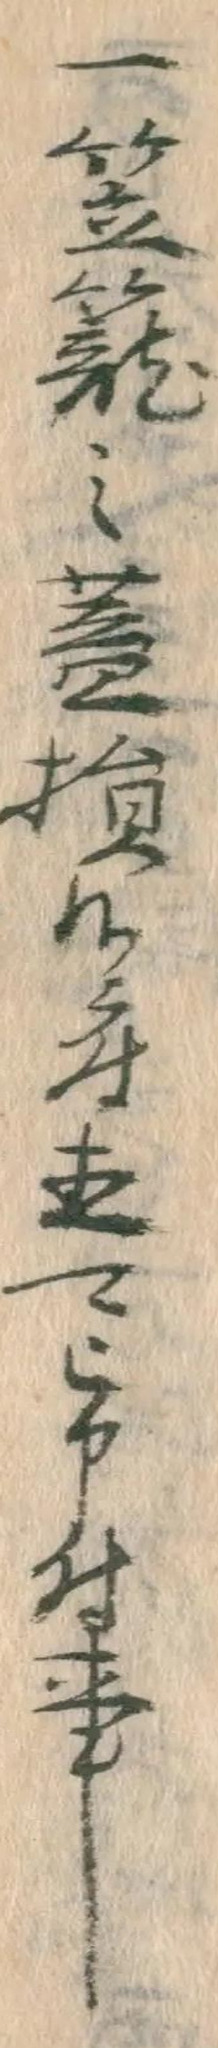一笠籠之蓋損候ニ付直可被申付事
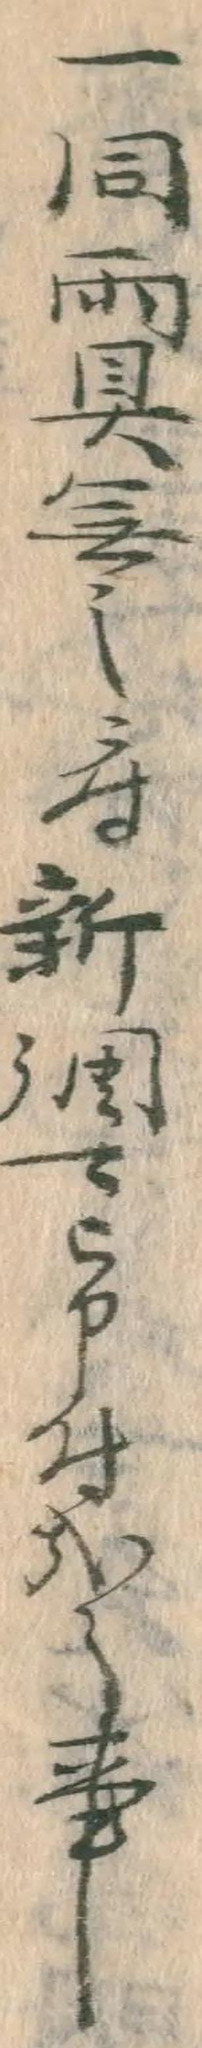一同雨具無之ニ付新調可被申付哉之事
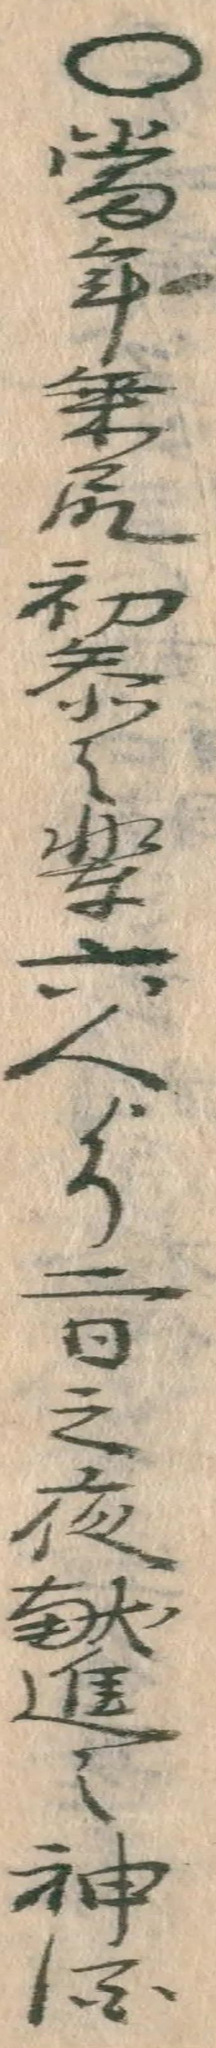〇當年乗尻初参之輩六人より二日之夜献進之神酒
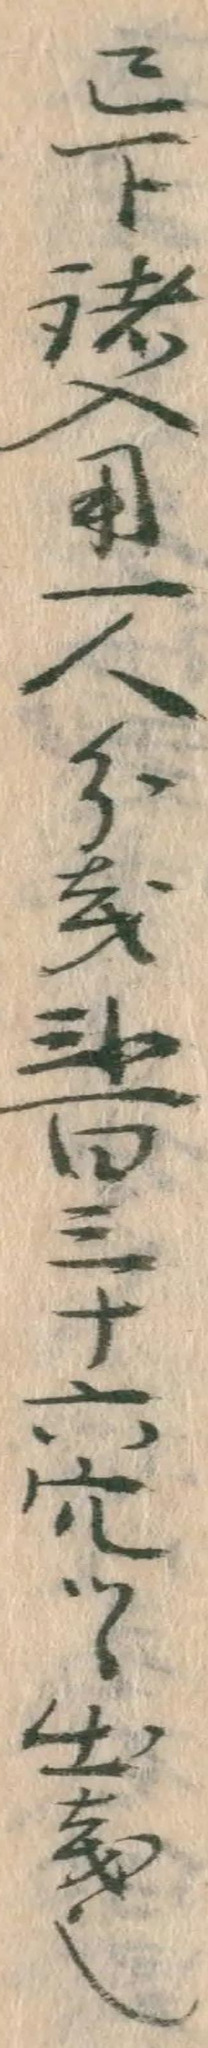已下諸入用一人分義弐百三十六穴ツヽ出義也
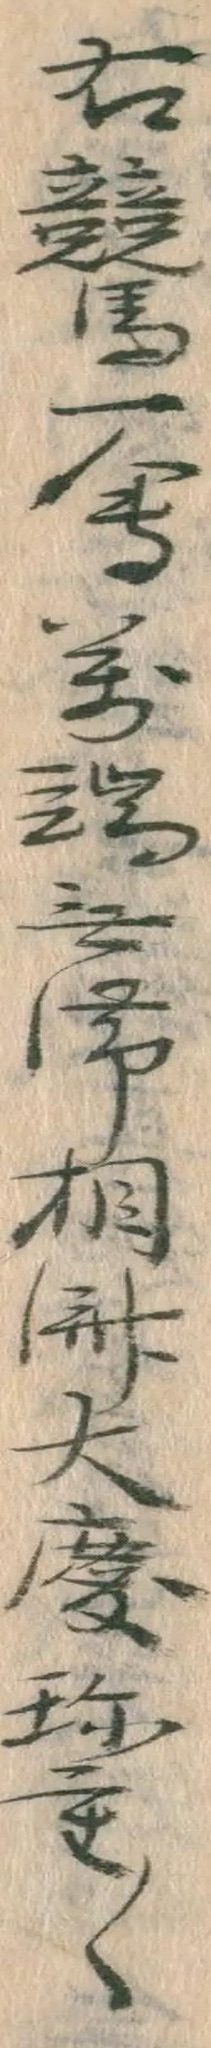右競馬一會萬端無滞相済大慶珍重〳〵
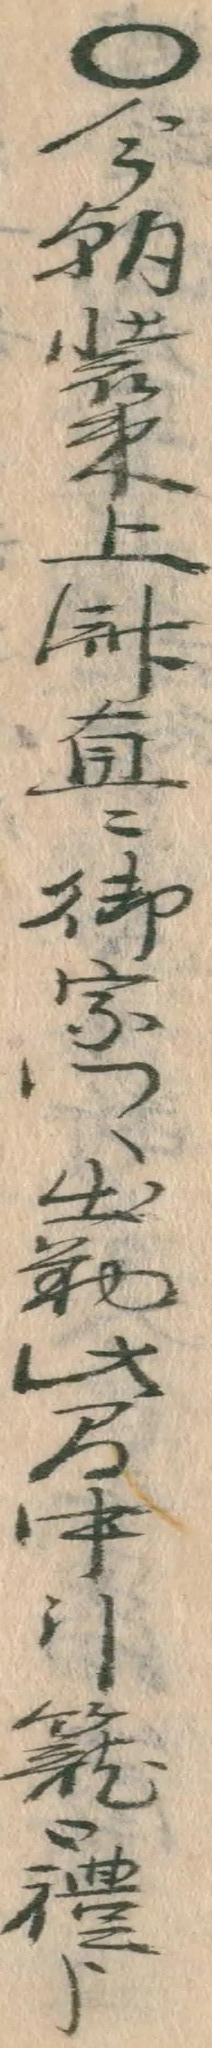○今朝装束上済直ニ御家門へ出勤此間中引籠御禮申
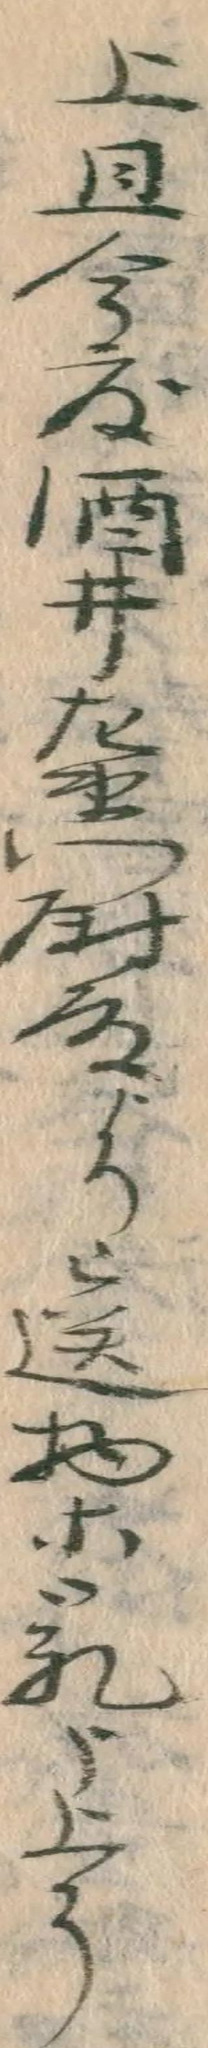上且今度酒井左衛門尉殿より被送物等御礼申上了
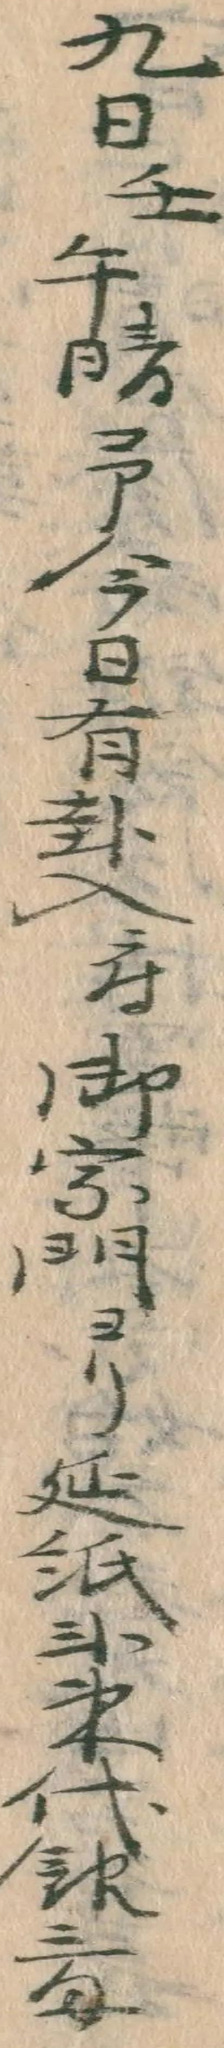九日壬午晴予今日有卦入ニ付御家門ヨリ延紙弐束代銀三匁
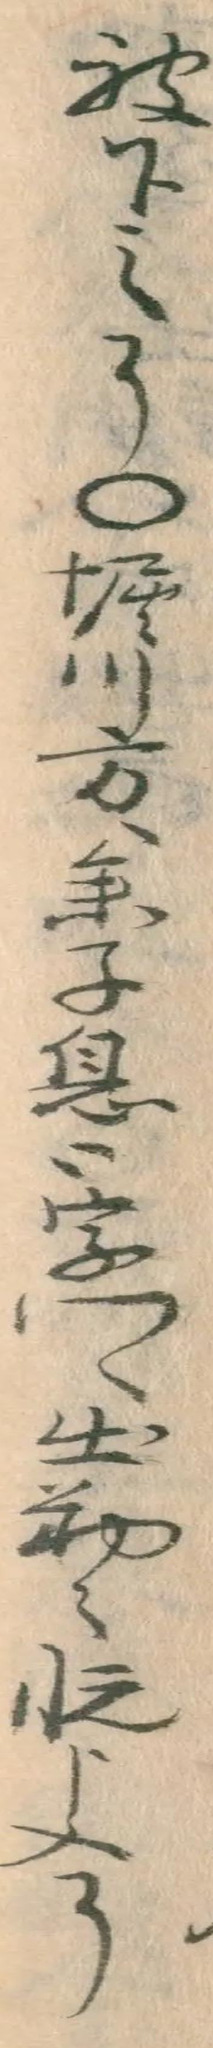被下之了○堀川方へ参子息御家門ヘ出勤之悦申入了
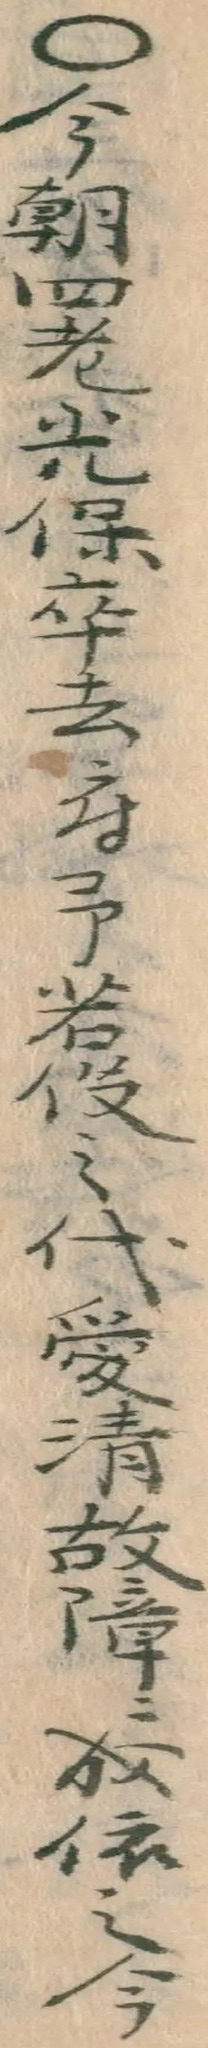○今朝四老光保卒去ニ付予若役之代愛清故障ニ成依之今
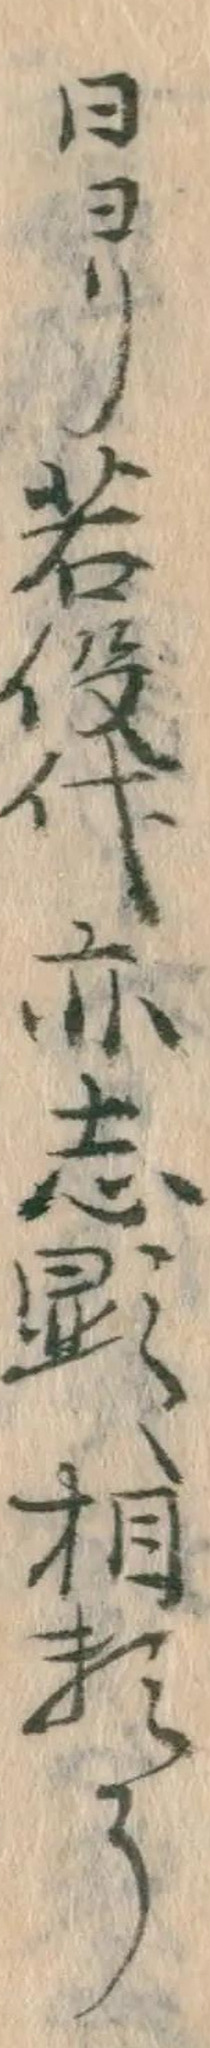日ヨリ若役代亦志顕へ相頼了
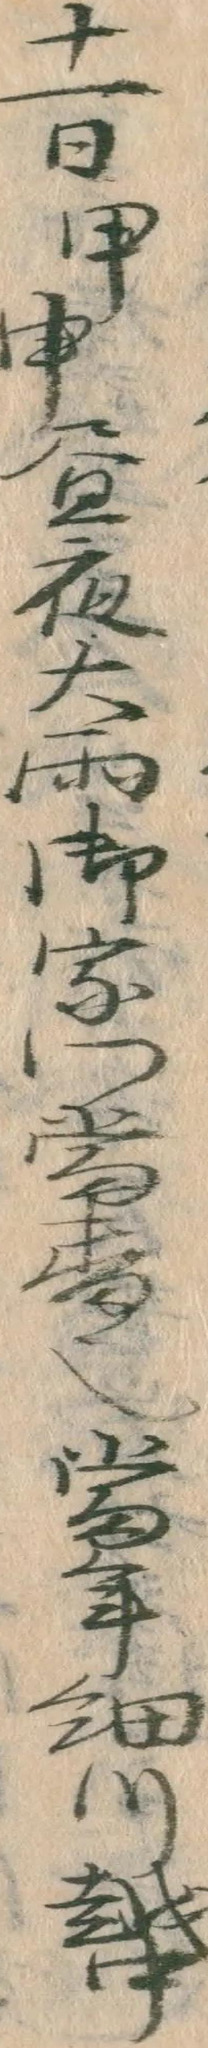十一日甲申昼夜大雨御家門當番也當年細川越中
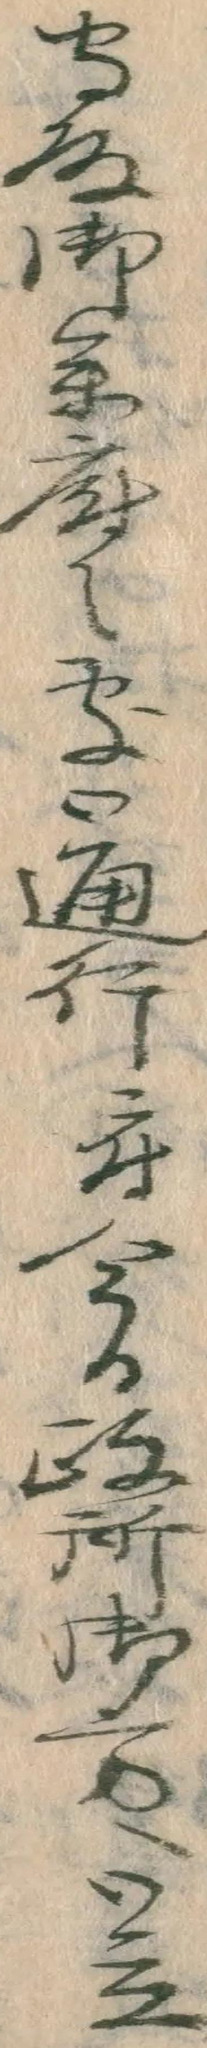守殿御参府之處御通行ニ付今日政所御方へ御立
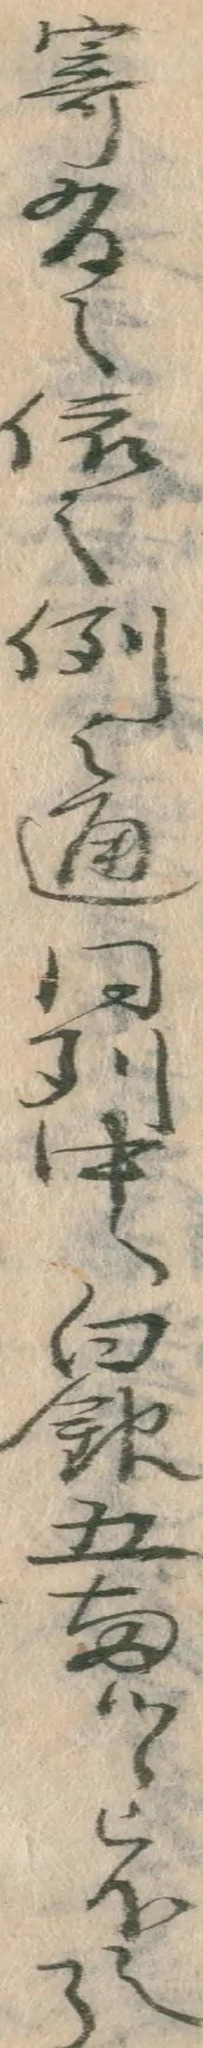寄有之依之例之通同列中へ白銀五両ツヽ被下之
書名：賀茂社記録. 第63冊
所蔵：国立国会図書館 National Diet Library, JAPAN
